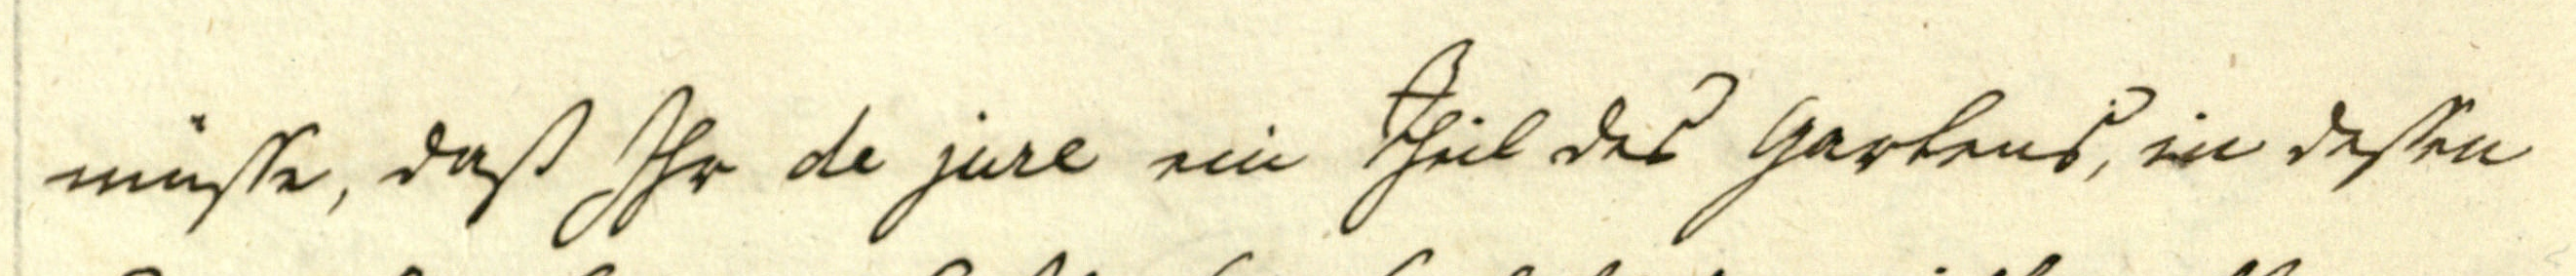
müsse, daß Ihr de jure ein Theil des Gartens, in dessen
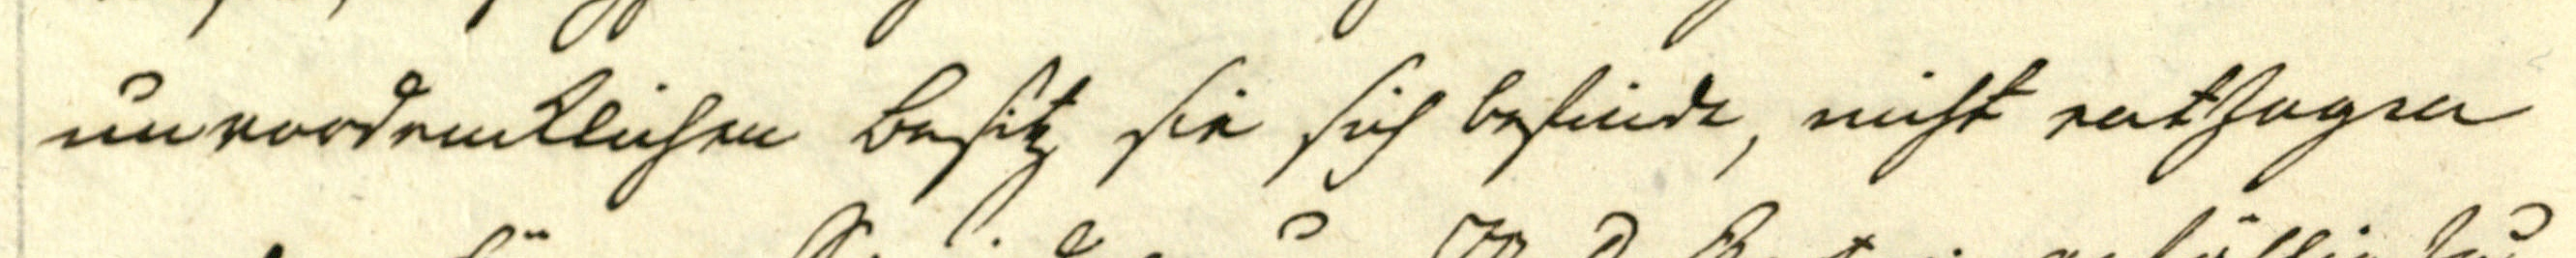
unvordencklichen Besitz sie sich befinde, nicht entzogen
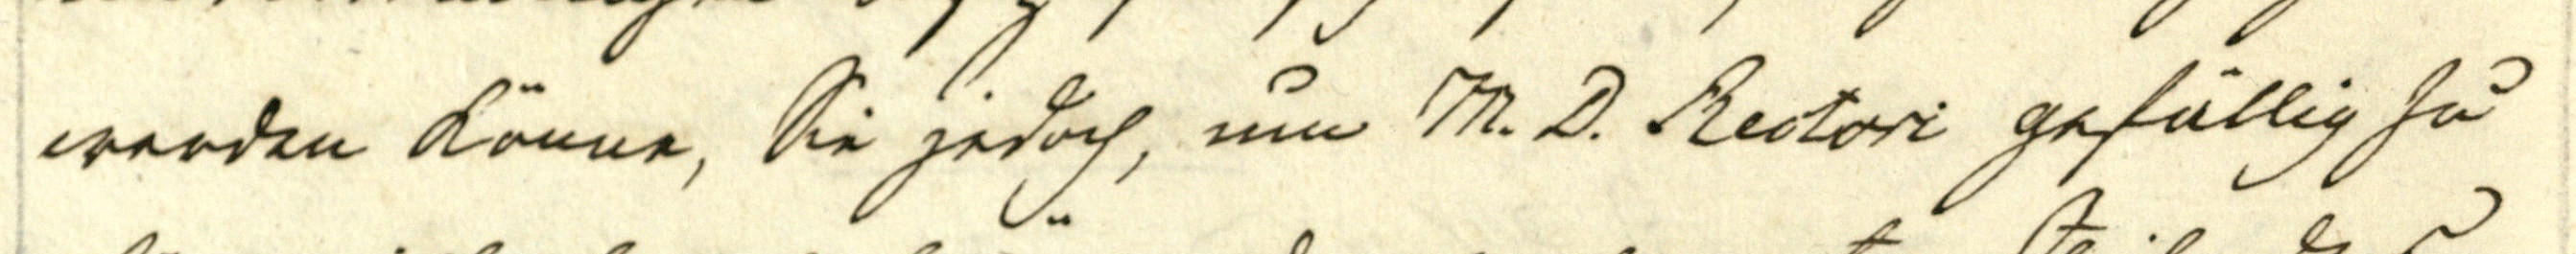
werden könne, Sie jedoch, um M. D. Rectori gefällig zu
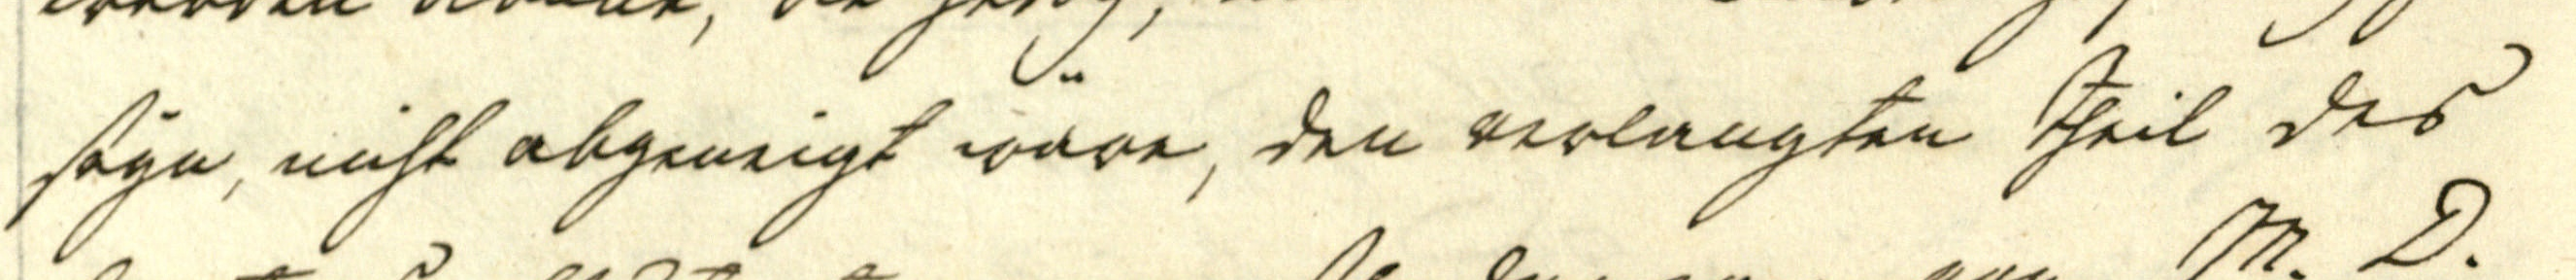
seÿn, nicht abgeneigt wäre, den verlangten Theil des
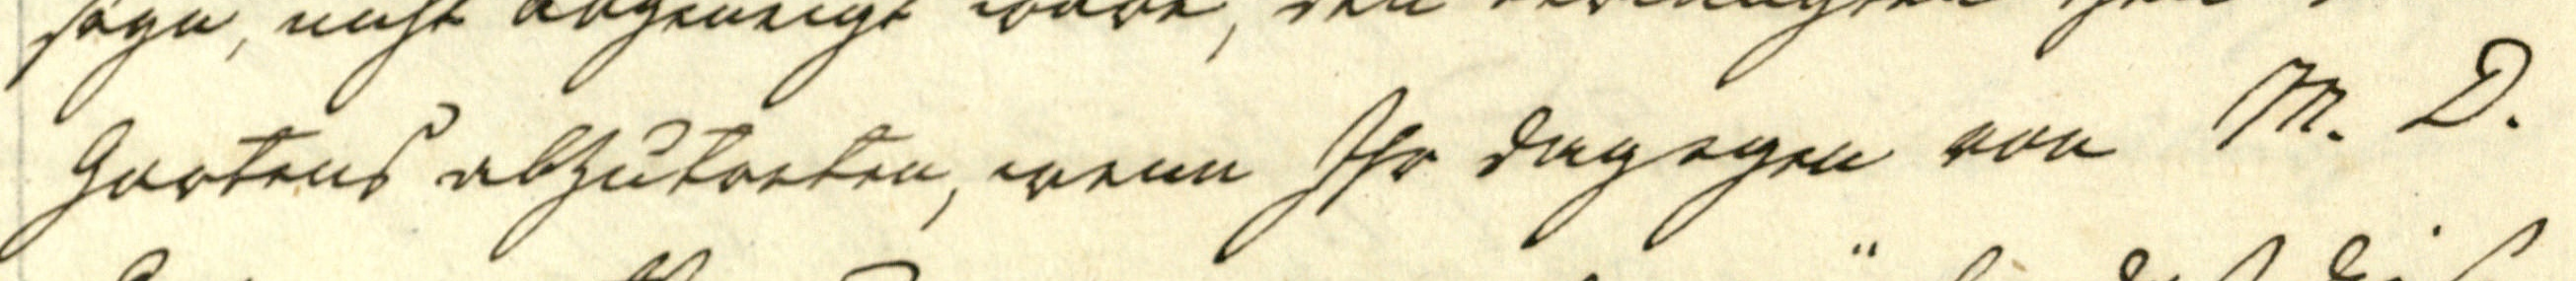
Gartens abzutreten, wenn Ihr dagegen von M. D.
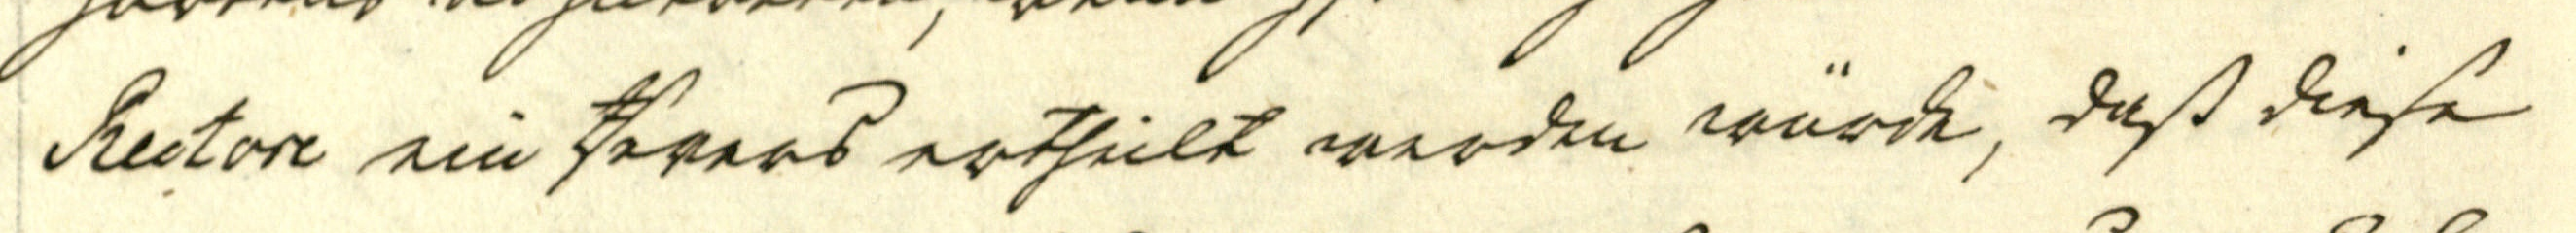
Rectore ein Revers ertheilt werden würde, daß diese
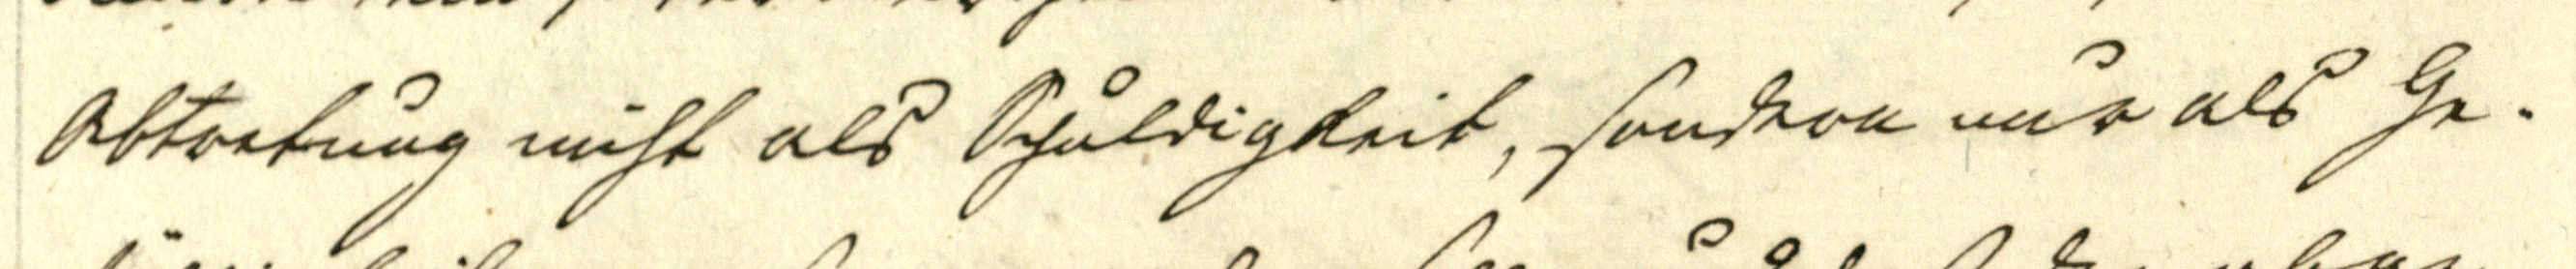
Abtretung nicht als Schuldigkeit, sondern nur als Ge¬
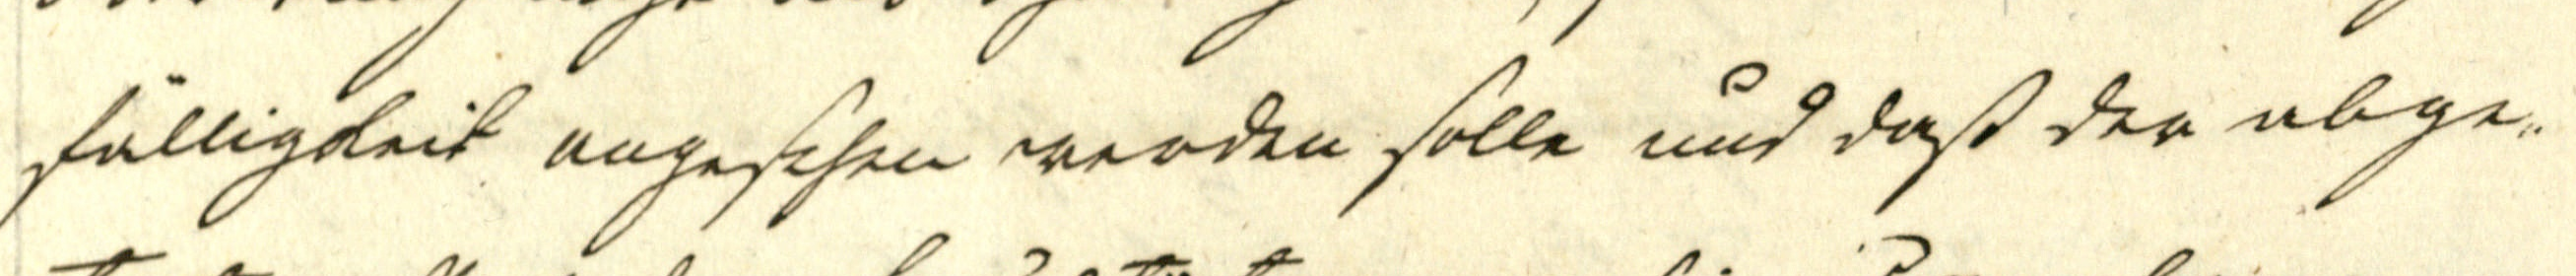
fälligkeit angesehen werden solle und daß der abge¬
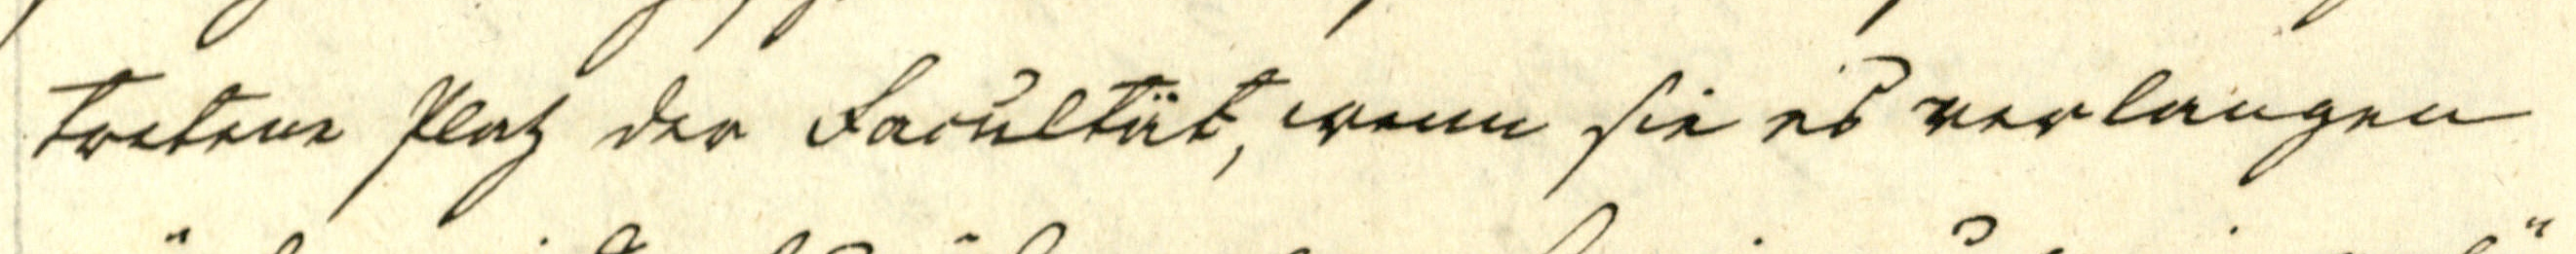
tretene Platz der Facultät, wenn sie es verlangen
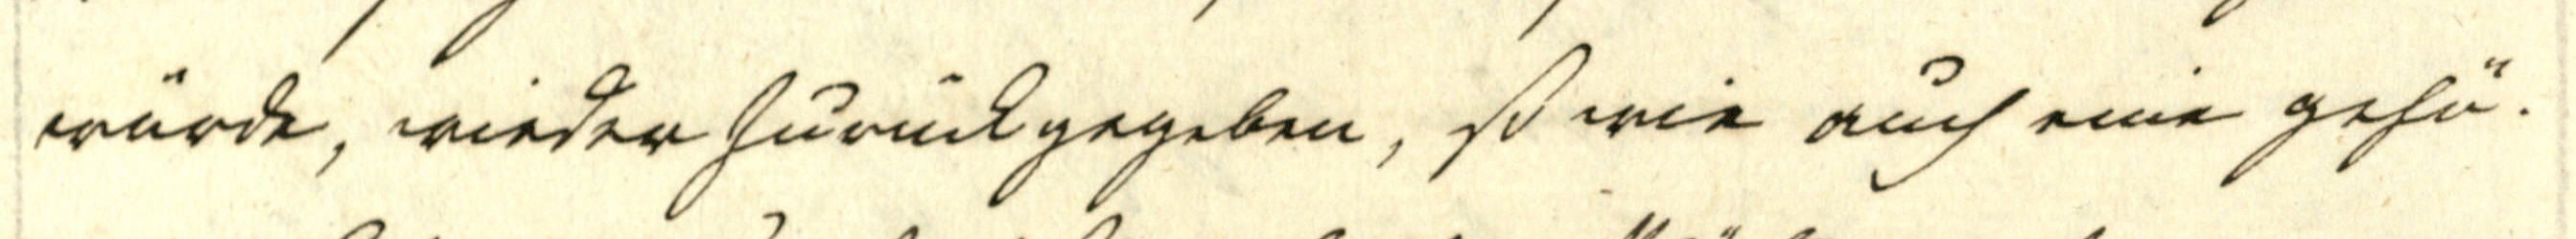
würde, wieder zurück gegeben, so wie auch eine gehö¬
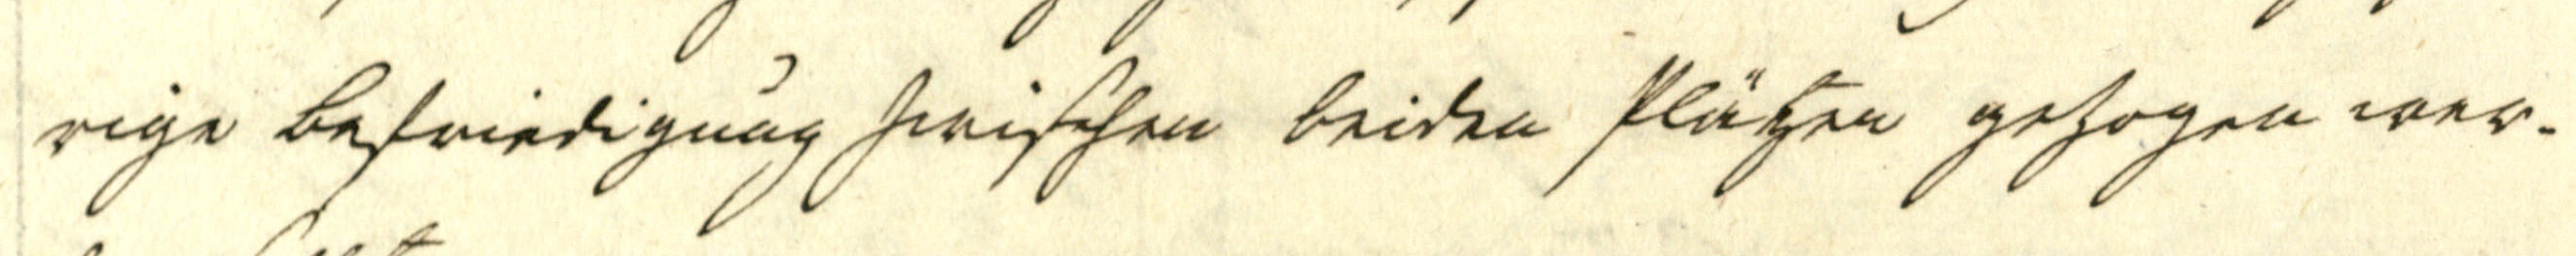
rige Befriedigung zwischen beiden Plätzen gezogen wer¬
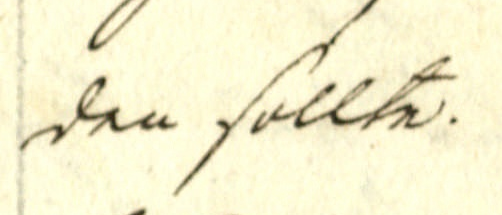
den sollte.
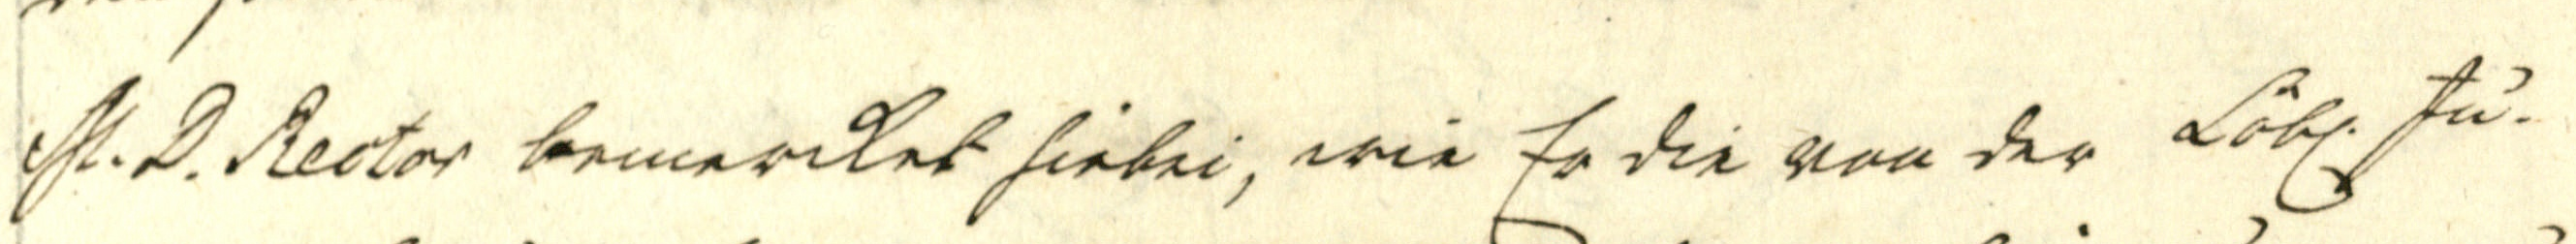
M. D. Rector bemercket hiebei, wie Er die von der Löbl. Ju¬
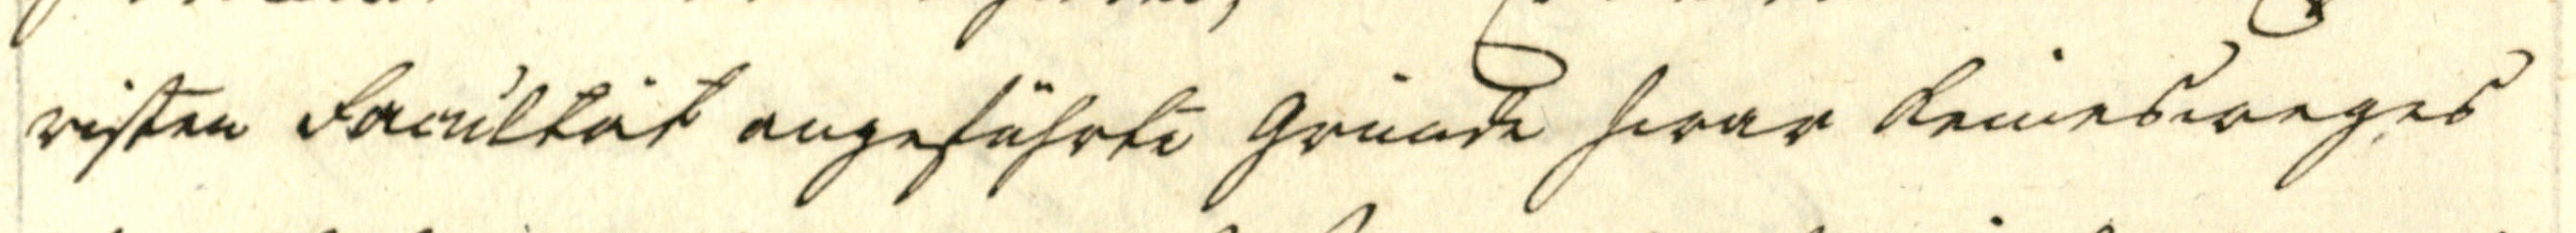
risten Facultät angeführte Gründe zwar keinesweges
